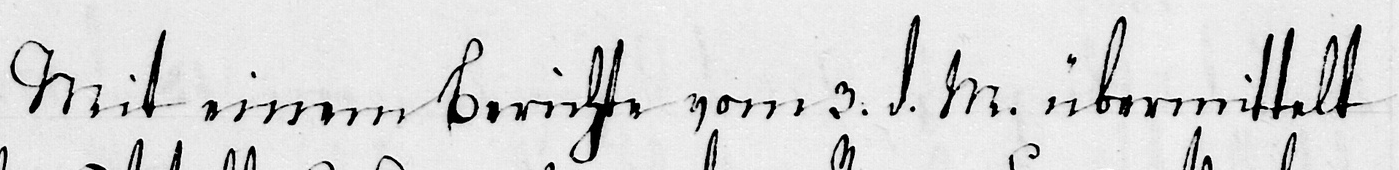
Mit einem Berichte vom 3. d. M. übermittelt
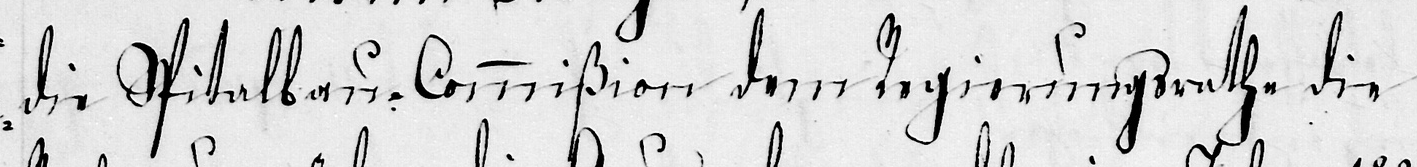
die Spitalbau-Commißion dem Regierungsrathe die
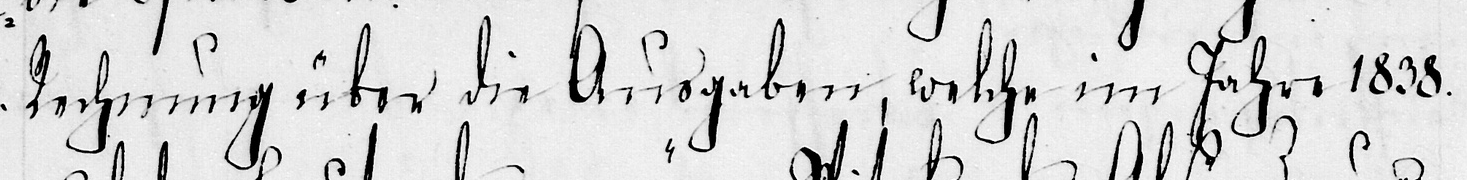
Rechnung über die Ausgaben, welche im Jahre 1838.
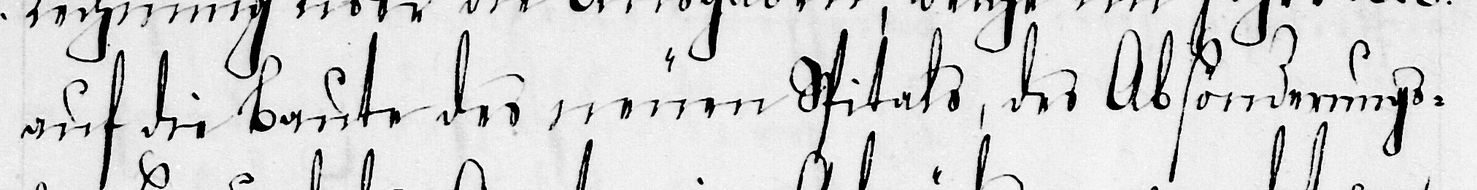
auf die Baute des neuen Spitals, des Absonderungs¬
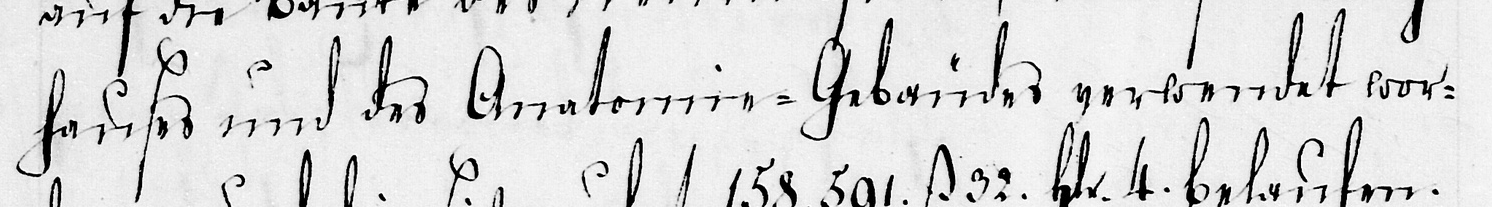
hauses und des Anatomie-Gebäudes verwendet wor¬
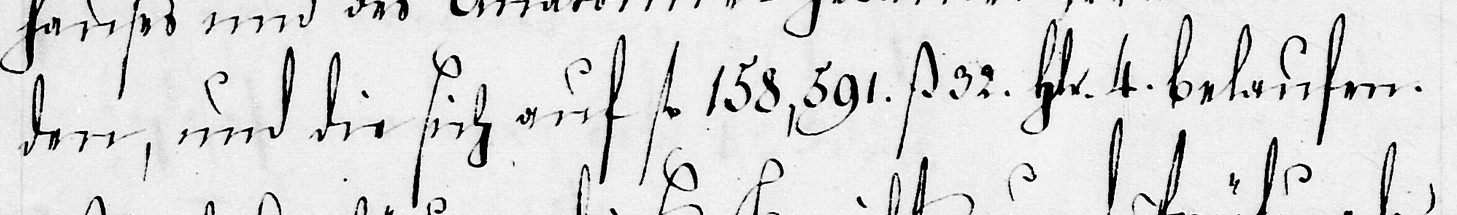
den, und die sich auf fl. 158,591 ß 32. Hlr. 4. belaufen.
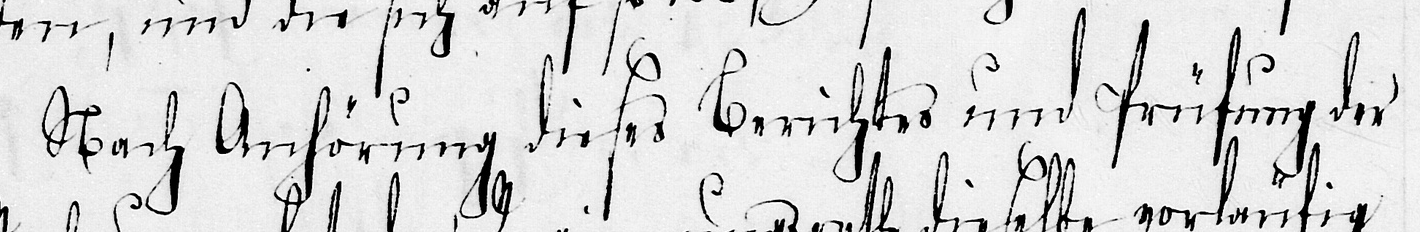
Nach Anhörung dieses Berichtes und Prüfung der
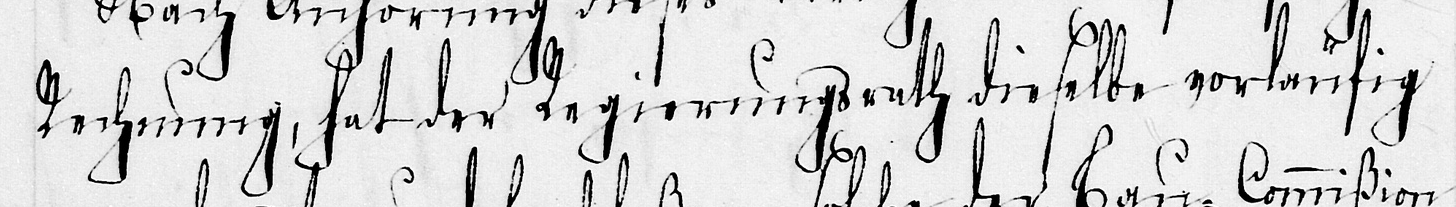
Rechnung, hat der Regierungsrath dieselbe vorläufig
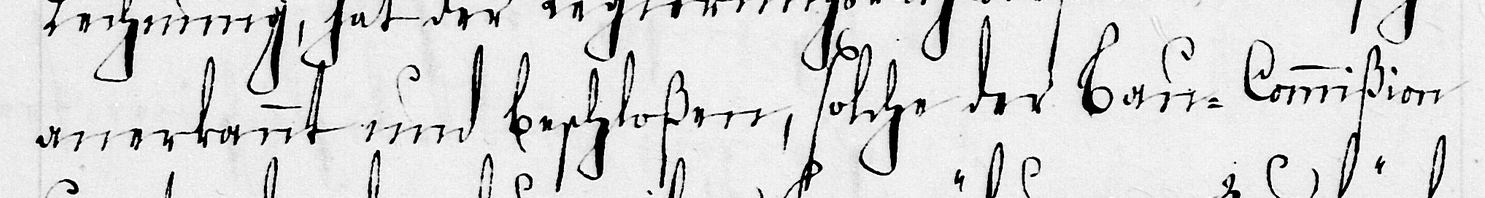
anerkannt und beschloßen, solche der Bau-Commißion
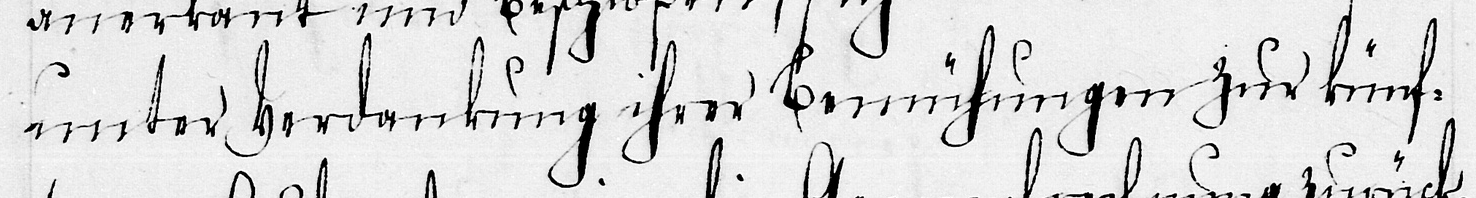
unter Verdankung ihrer Bemühungen zur künf¬
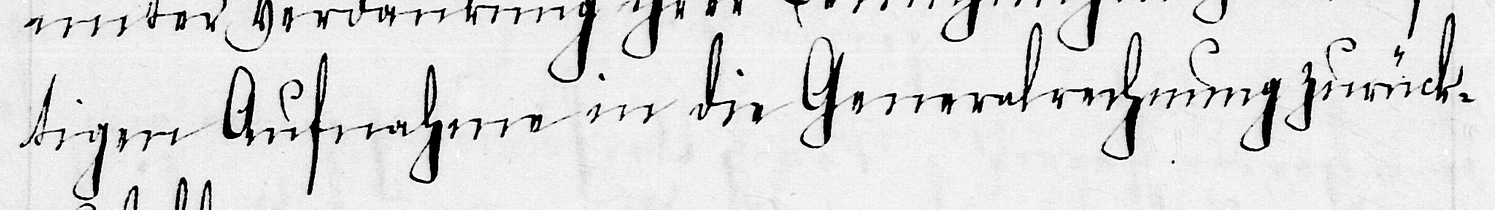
tigen Aufnahme in die Generalrechnung zurück¬
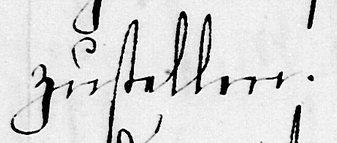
zustellen.
